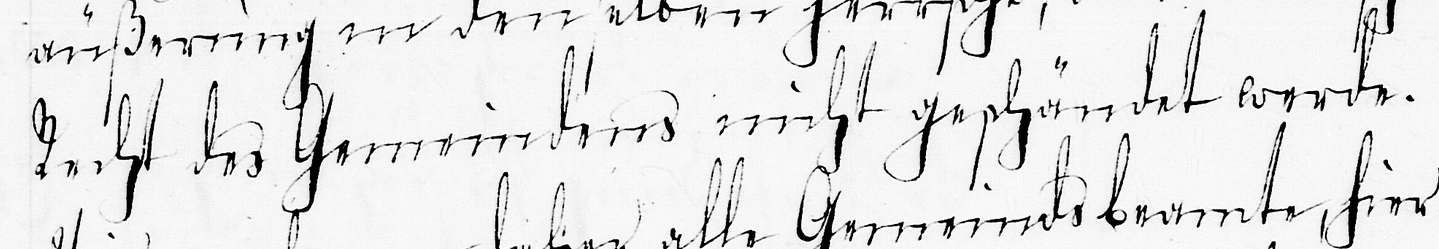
Recht des Gemeindens nicht geschändet werde.
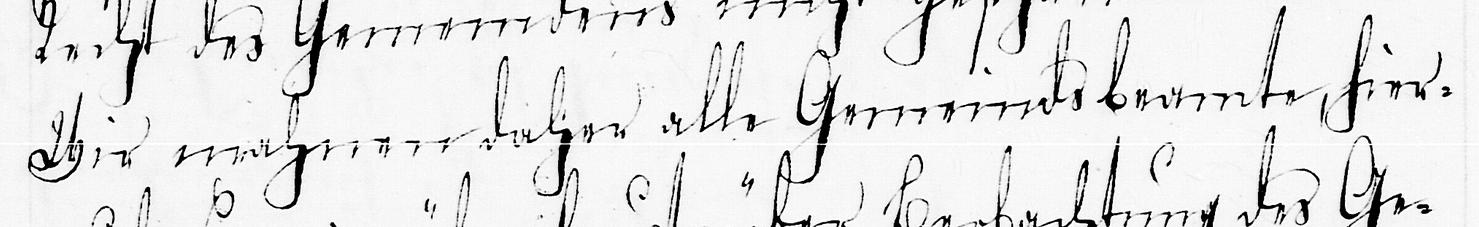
Wir mahnen daher alle Gemeindsbeamte, hier¬
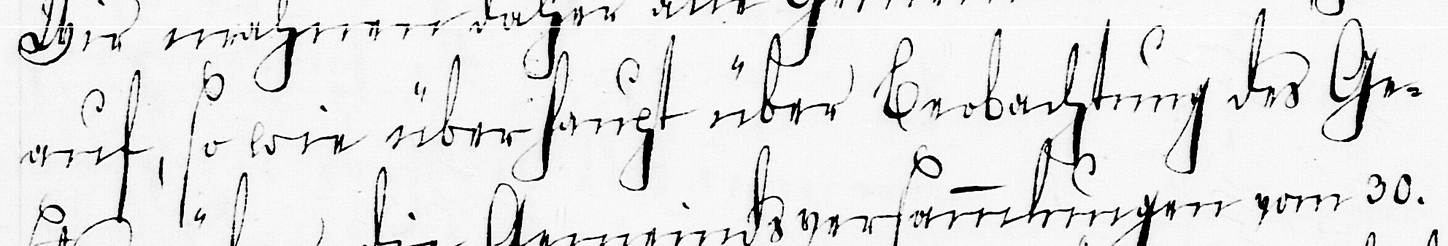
auf, so wie überhaupt über Beobachtung des Ge¬
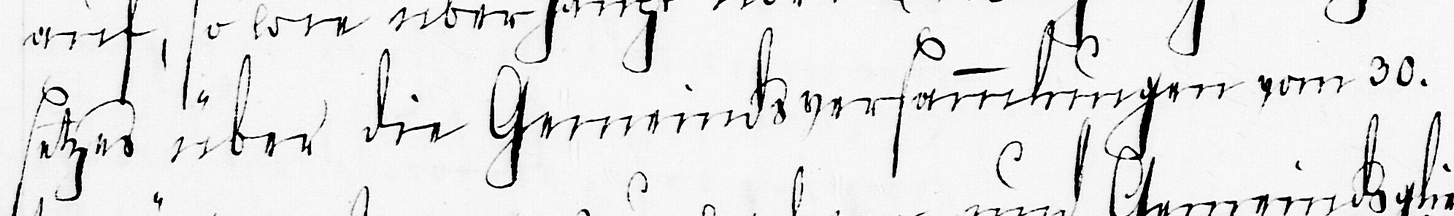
setzes über die Gemeindsversammlungen vom 30.
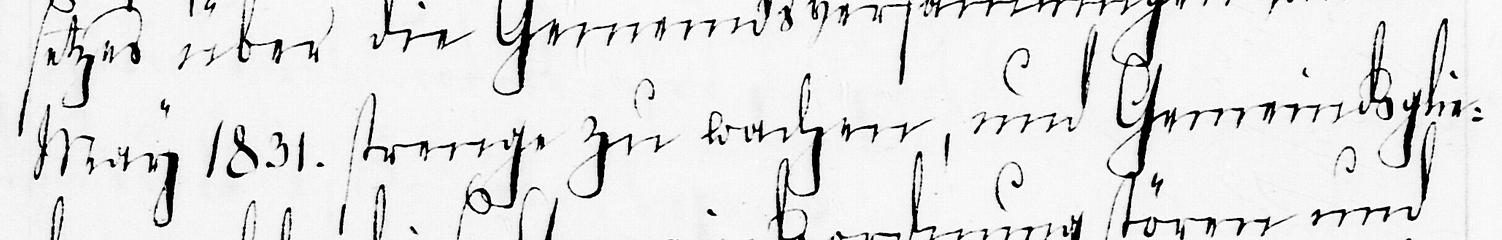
May 1831. strenge zu wachen, und Gemeindsglie¬
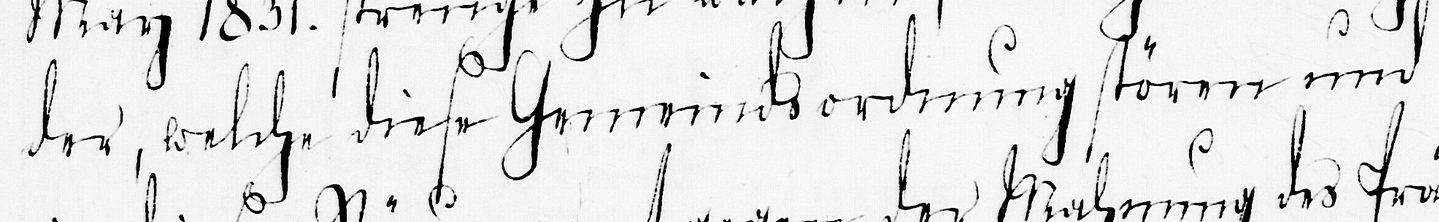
der, welche diese Gemeindsordnung stören und
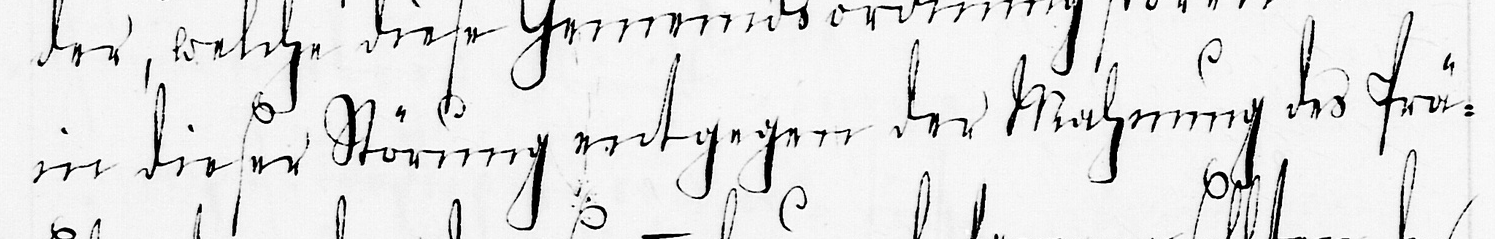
in dieser Störung entgegen der Mahnung des Prä¬
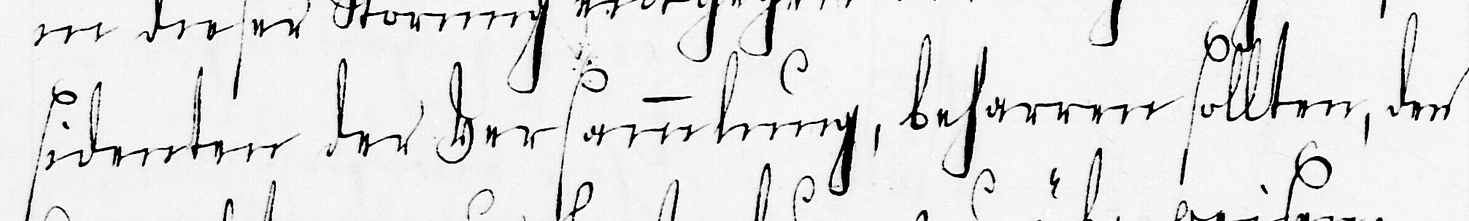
sidenten der Versammlung, beharren sollten, den
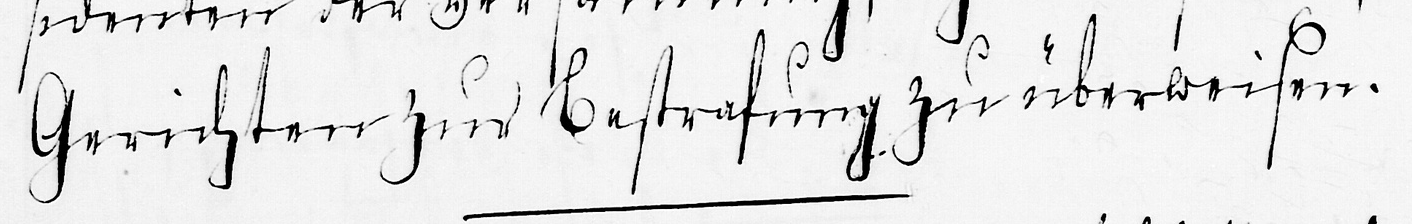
Gerichten zur Bestrafung zu überweisen.
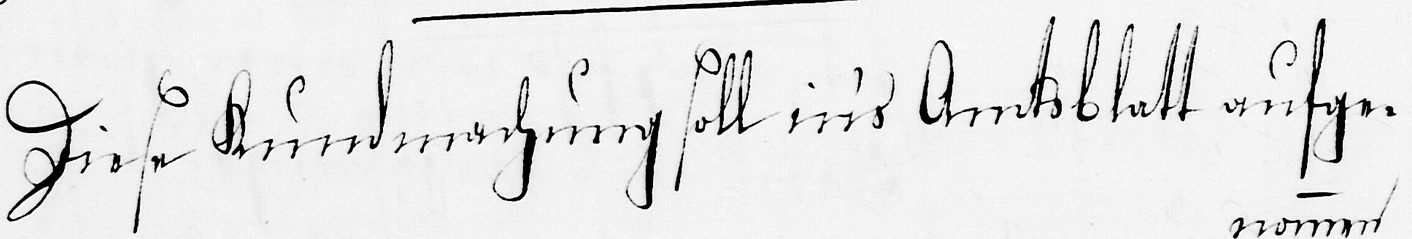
Diese Kundmachung soll in‘s Amtsblatt aufge-
